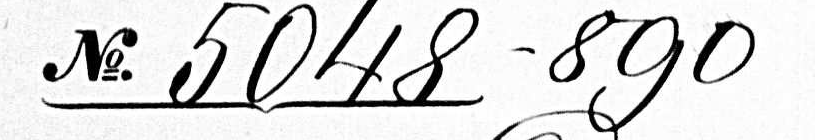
No. 5048 - 890
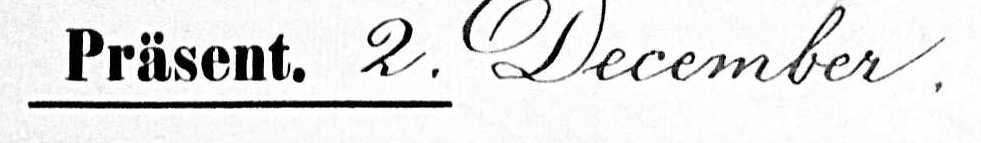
Präsent. 2. December.
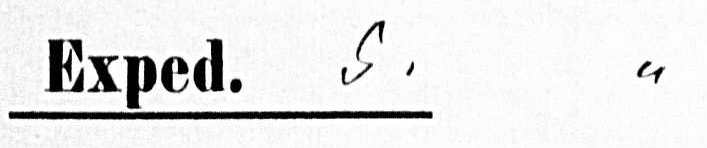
Exped. 5. December.
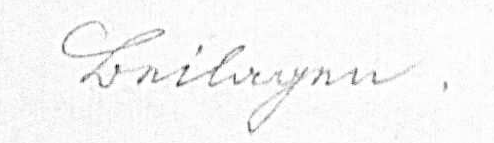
Beilagen.
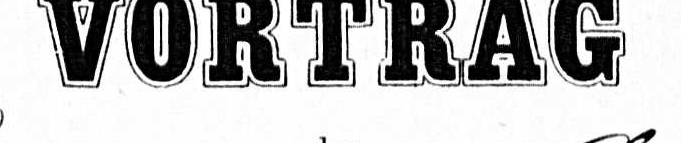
Vortrag
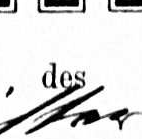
des
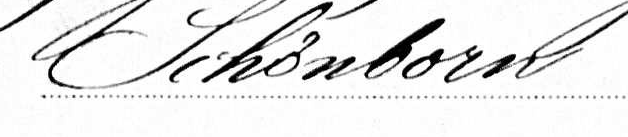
Schönborn
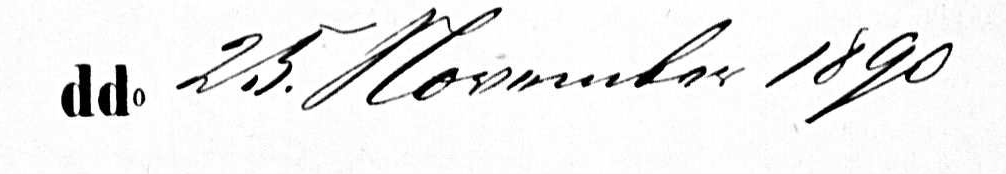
ddo 25. November 1890
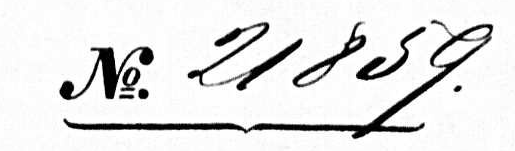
No. 21859.
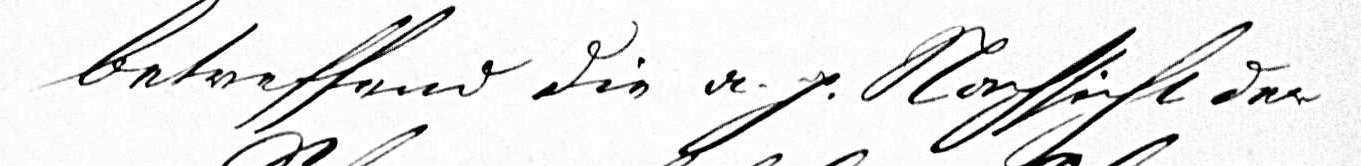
betreffend die a. g. Nachsicht der
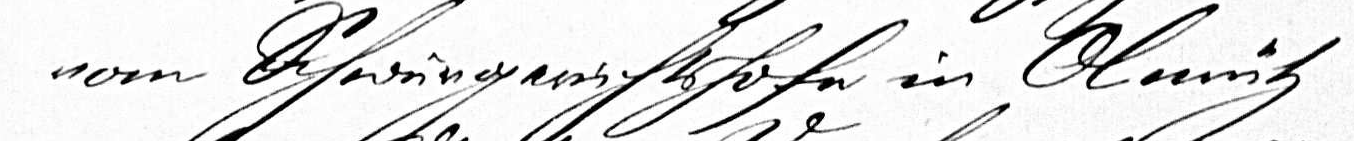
vom Schwurgerichtshofe in Olmütz
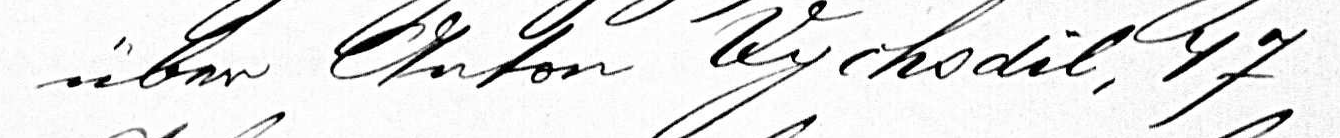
über Anton Vychsdil, 47
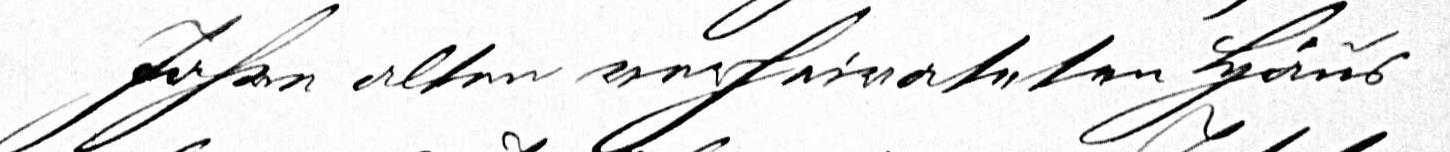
Jahre alten verheirateten Häus
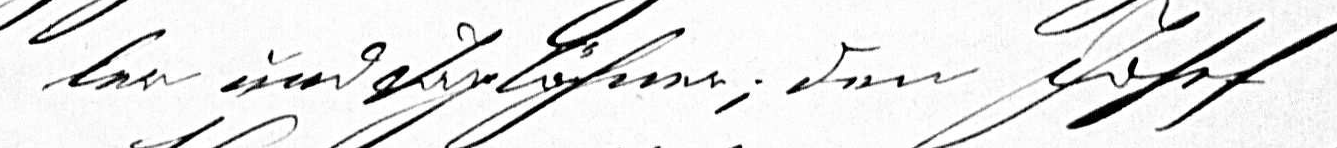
ler und Taglöhner; den Josef
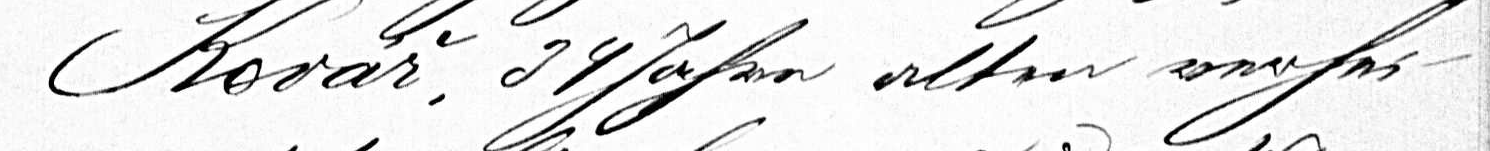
Kovár, 34 Jahre alten verhei¬
